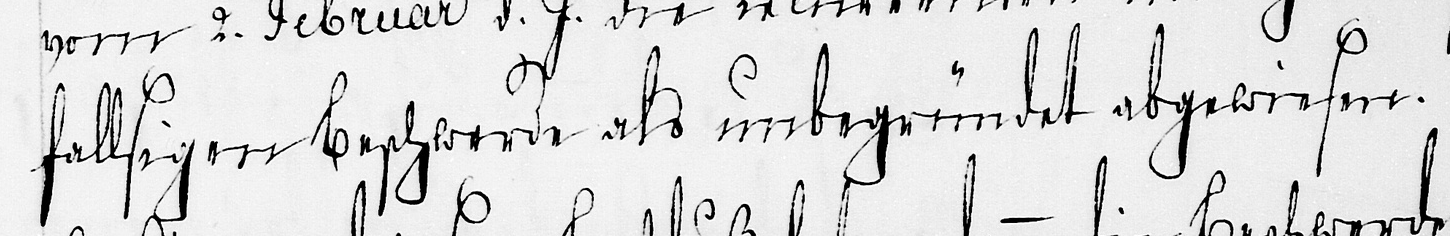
fallsigen Beschwerde als unbegründet abgewiesen.
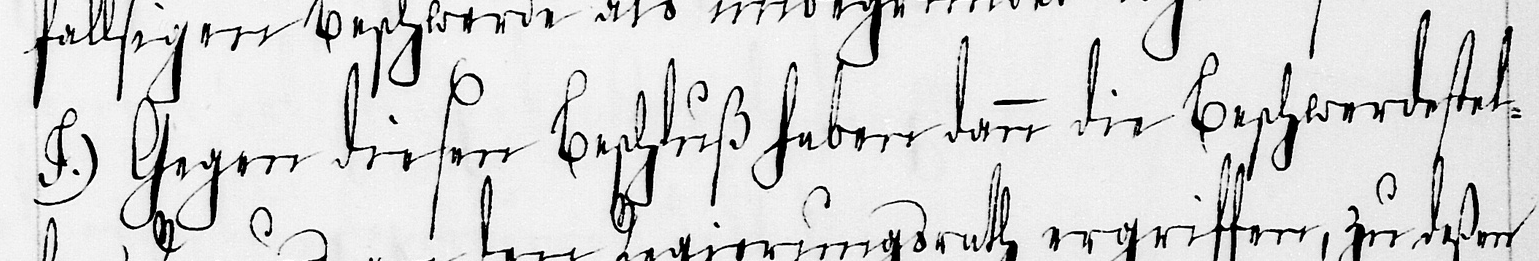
F.) Gegen diesen Beschluß haben dann die Beschwerdeste¬
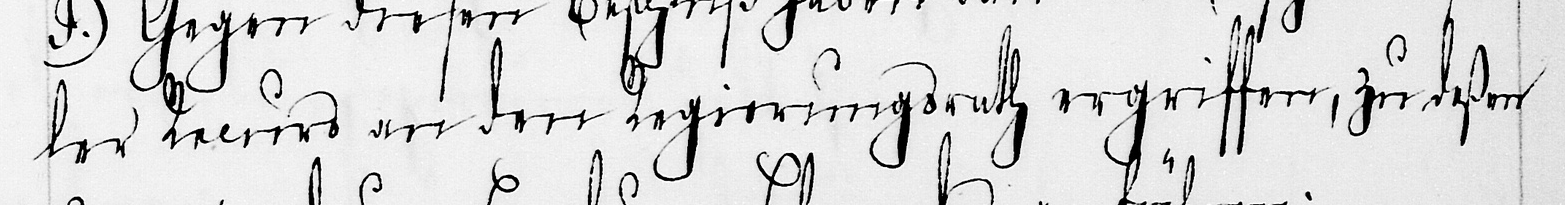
ler Recurs an den Regierungsrath ergriffen, zu deßen
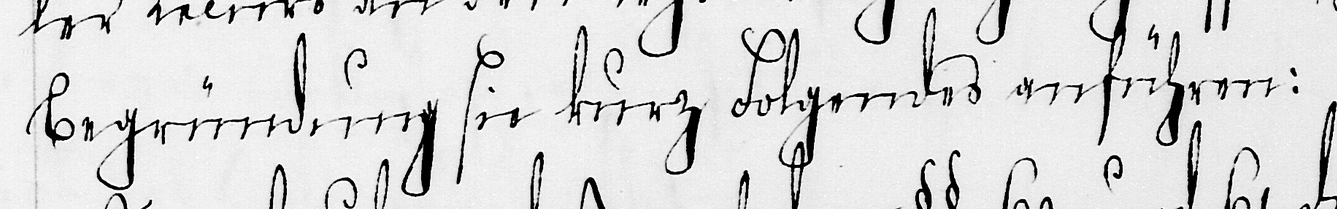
Begründung sie kurz Folgendes anführen:
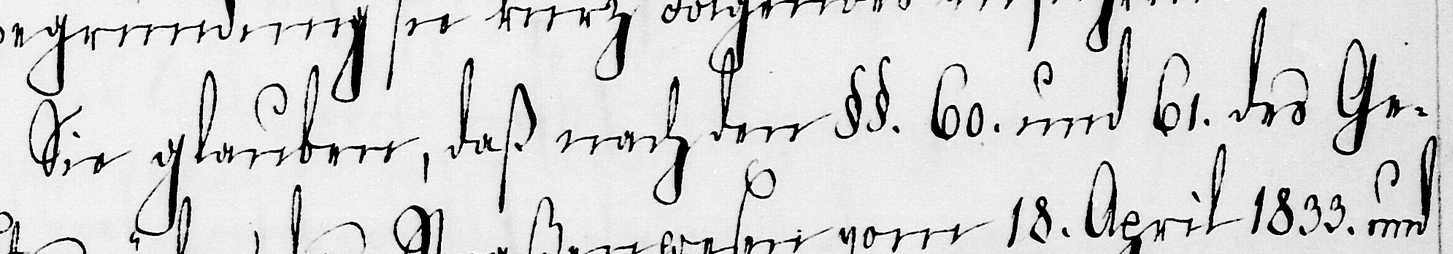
Sie glauben, daß nach den §§. 60. und 61. des Ge¬
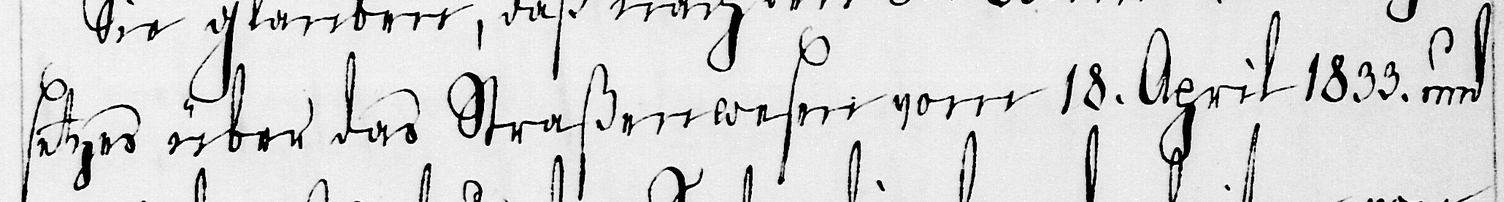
setzes über das Straßenwesen vom 18. April 1833. und
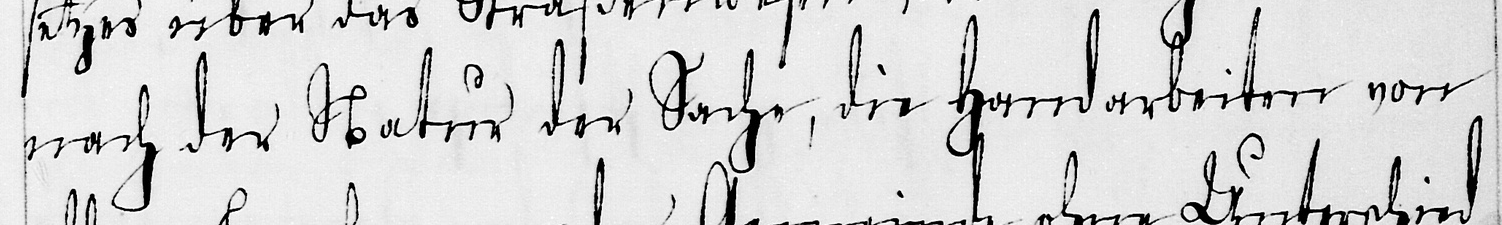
nach der Natur der Sache, die Handarbeiten von
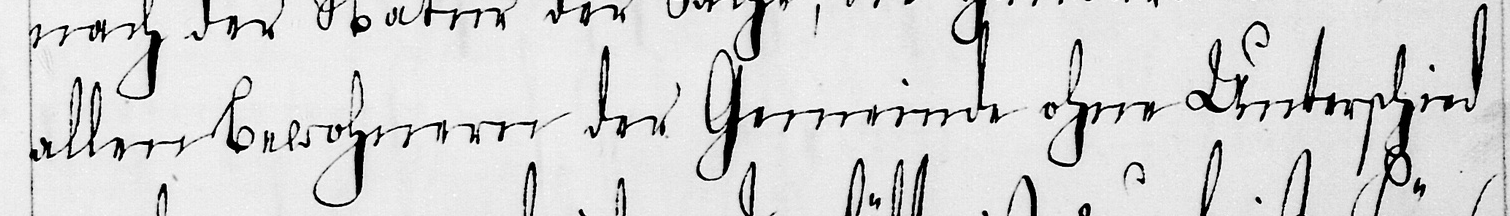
allen Bewohnern der Gemeinde ohne Unterschied
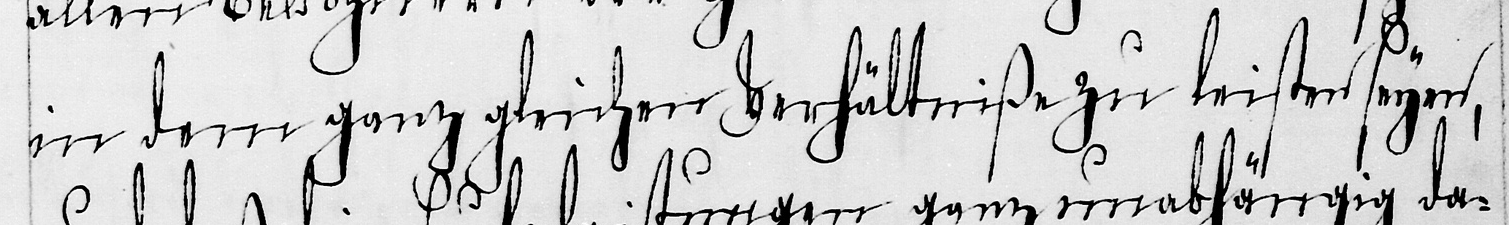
in dem ganz gleichen Verhältniße zu leisten seyen,
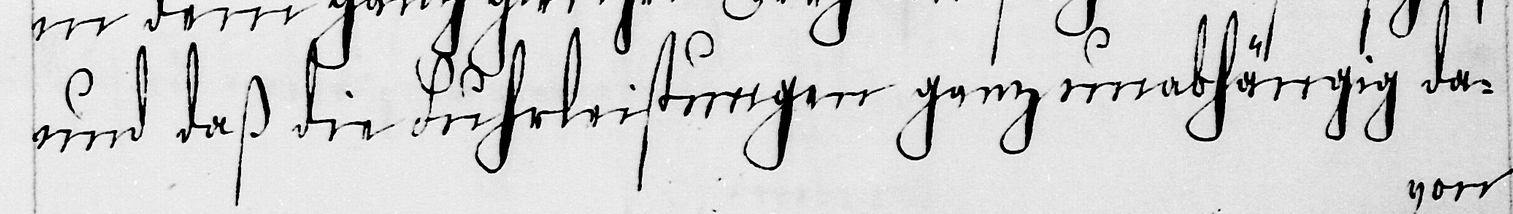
und daß die Fuhrleistungen ganz unabhängig da-
